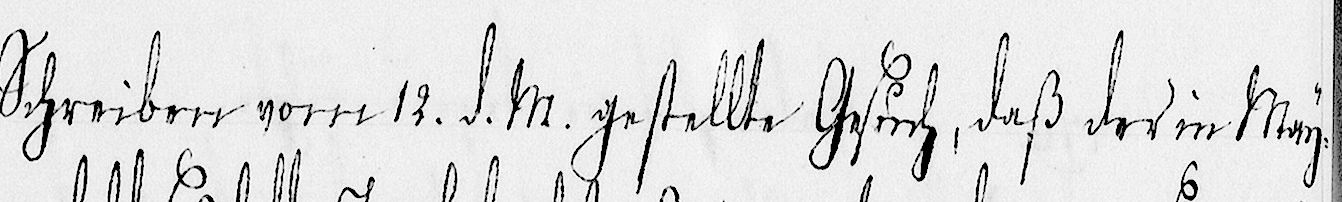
Schreiben vom 12. d. M. gestellte Gesuch, daß der in May¬
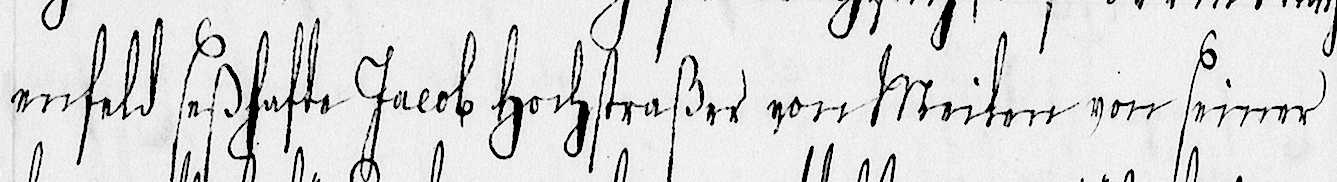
enfeld seßhafte Jacob Hochstraßer von Meilen von seiner
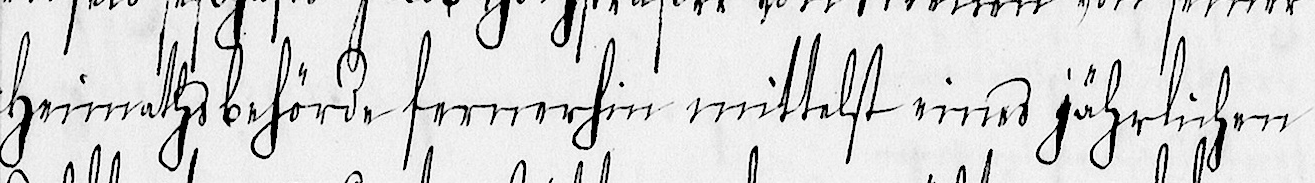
Heimathbehörde fernerhin mittelst eines jährlichen
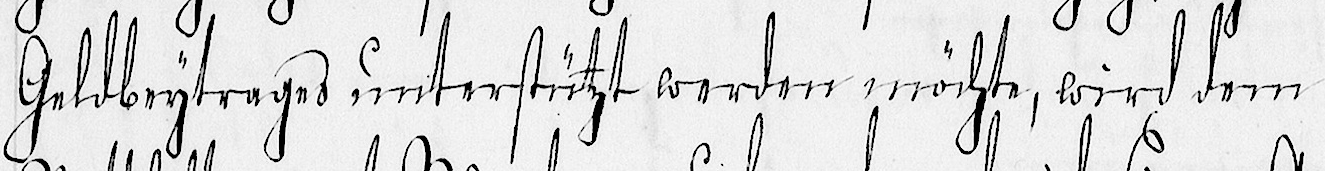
Geldbeytrages unterstützt werden möchte, wird dem
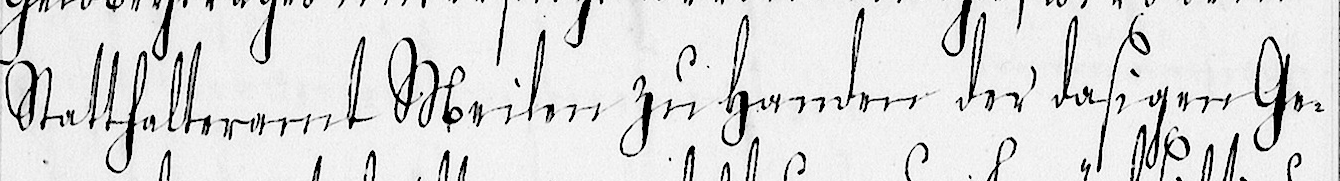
Statthalteramt Meilen zu Handen der dasigen Ge¬
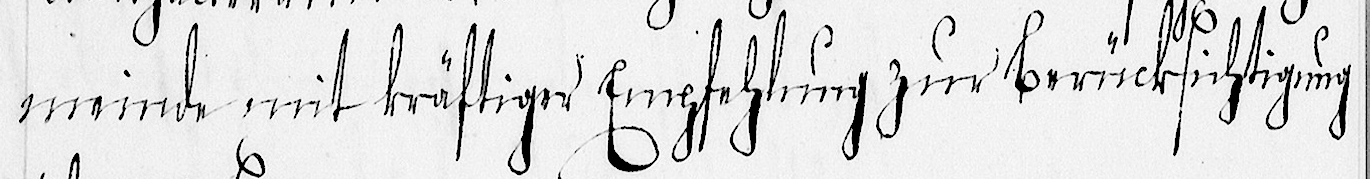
meinde mit kräftiger Empfehlung zur Berücksichtigung
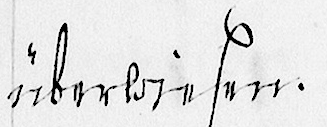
überwiesen.
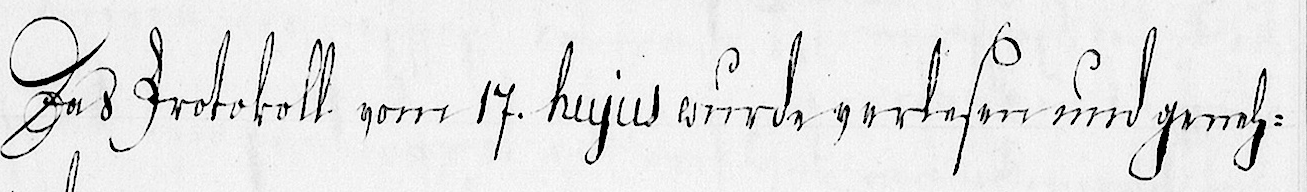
Das Protokoll vom 17. hujus wurde verlesen und geneh¬
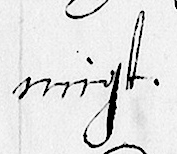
migt.
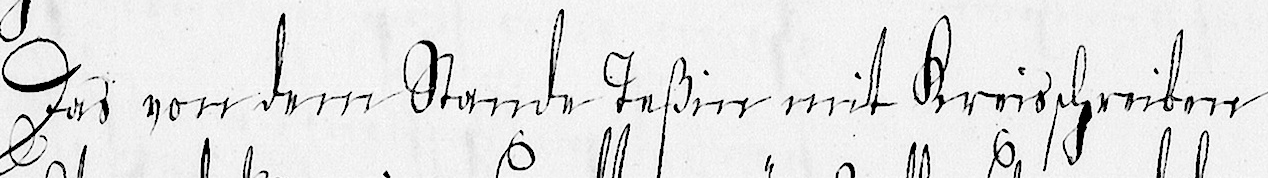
Das von dem Stande Teßin mit Kreisschreiben
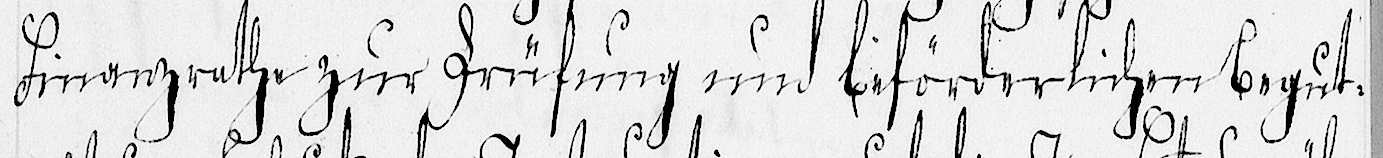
Finanzrathe zur Prüfung und beförderlichen Begut¬
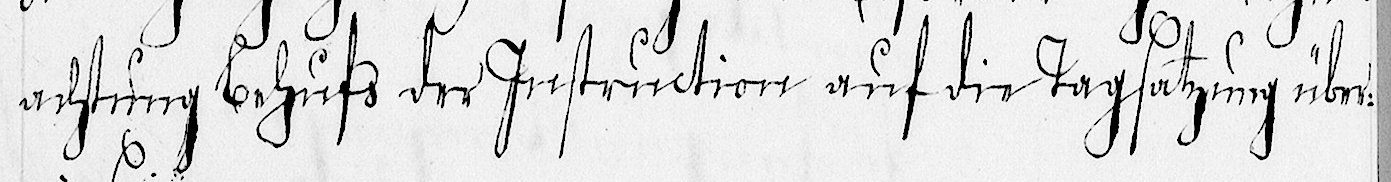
achtung Behufs der Instruction auf die Tagsatzung über¬
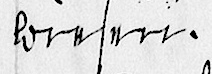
wiesen.
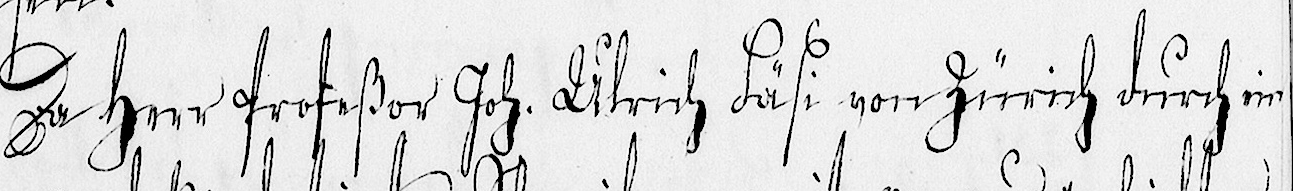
Da Herr Profeßor Joh. Ulrich Fäsi von Zürich durch e¬
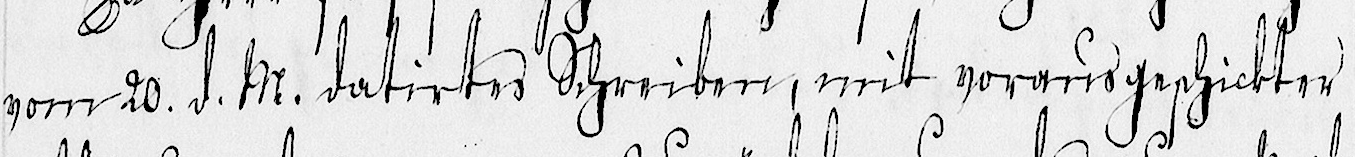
vom 20. d. M. datirtes Schreiben, mit vorausgeschickter
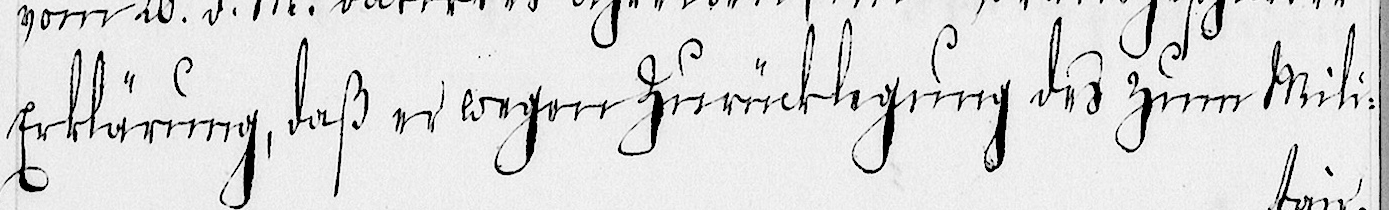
Erklärung, daß er wegen Zurücklegung des zum Mili-
